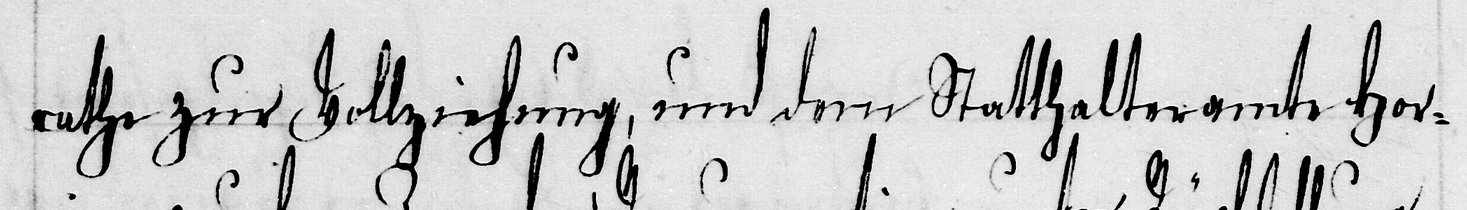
rathe zur Vollziehung, und dem Statthalteramte Hor¬
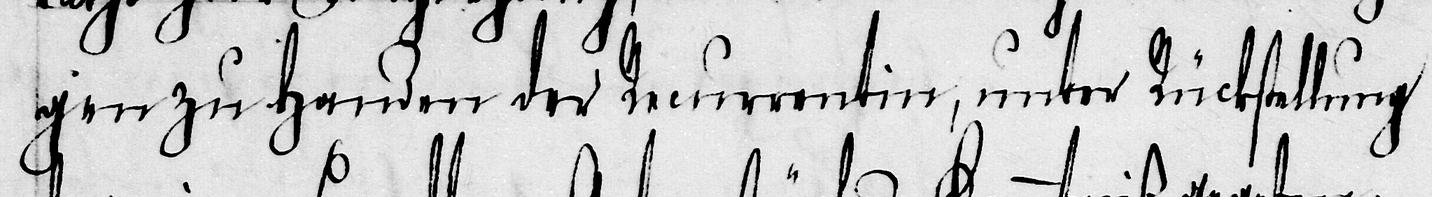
gen zu Handen der Recurrentin, unter Rückstellung
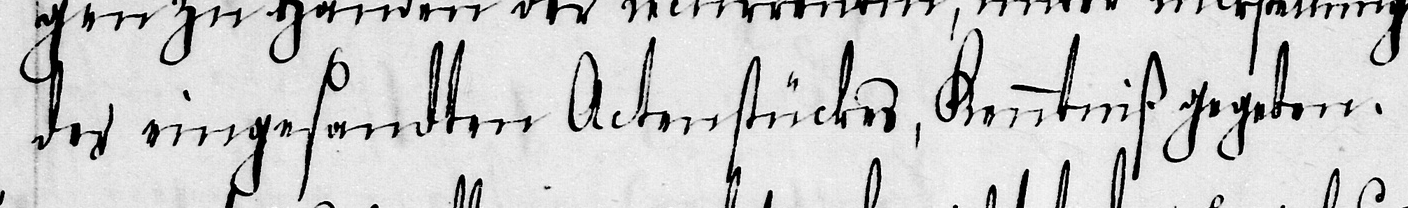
des eingesandten Actenstückes, Kenntniß gegeben.
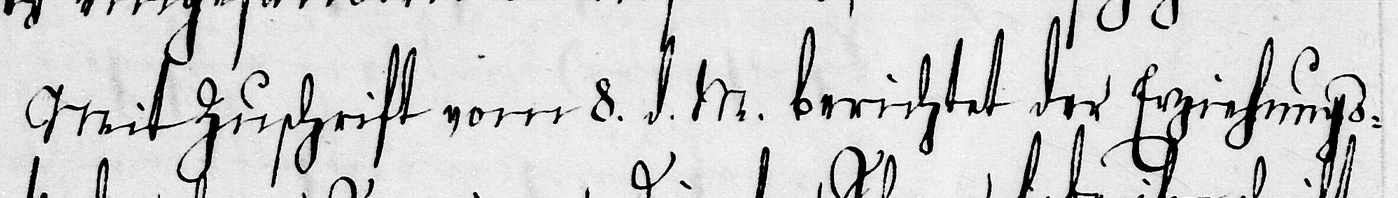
Mit Zuschrift vom 8. d. M. berichtet der Erziehungs¬
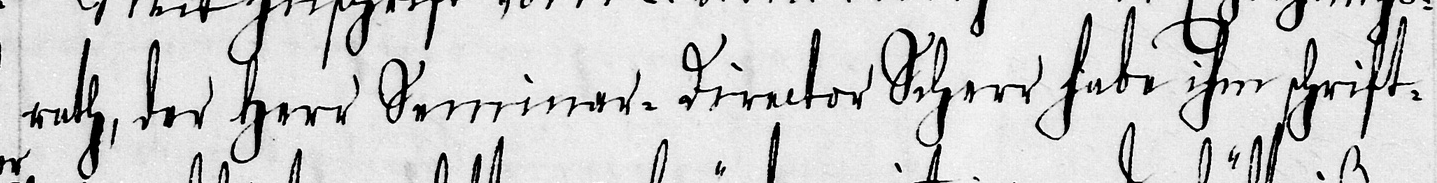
rath, der Herr Seminar-Director Scherr habe ihm schrift¬
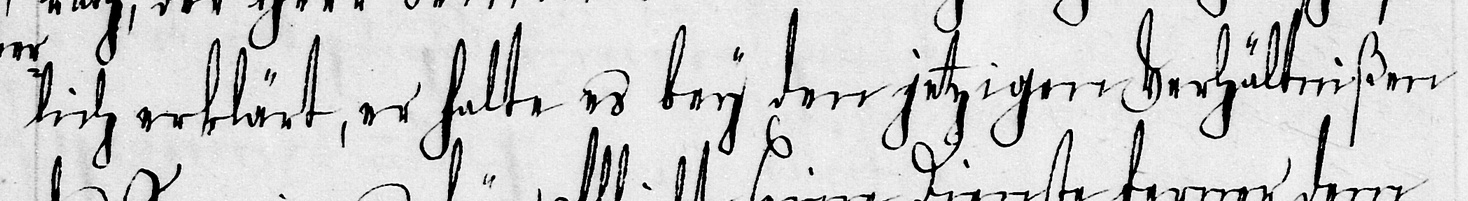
lich erklärt, er halte es bey den jetzigen Verhältnißen
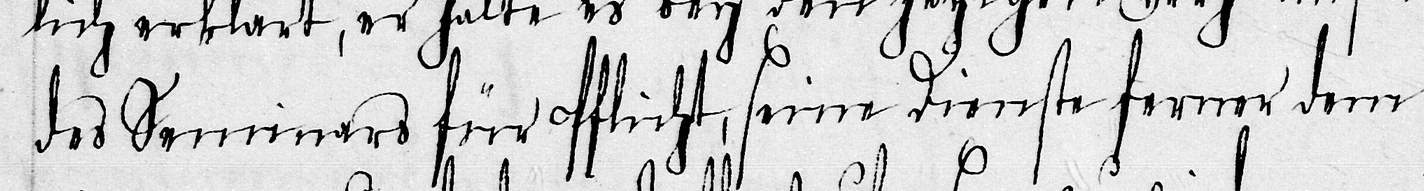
des Seminars für Pflicht, seine Dienste ferner dem
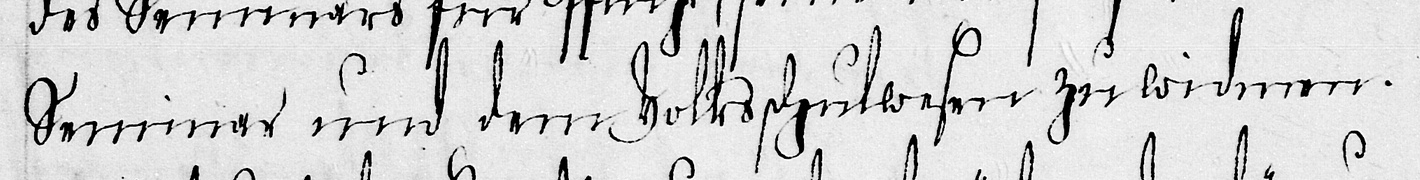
Seminar und dem Volksschulwesen zu widmen.
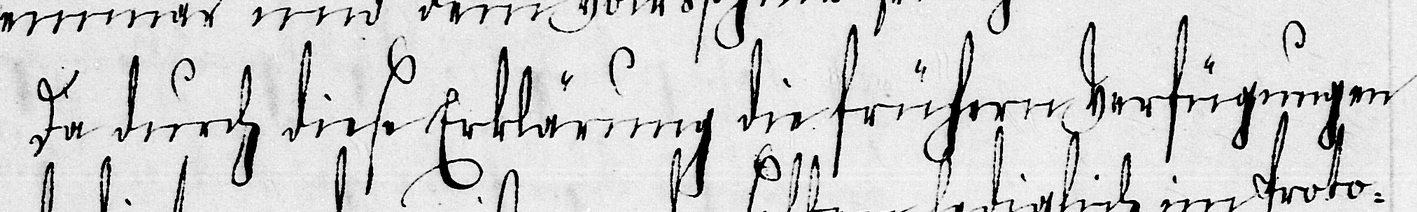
Da durch diese Erklärung die frühern Verfügungen
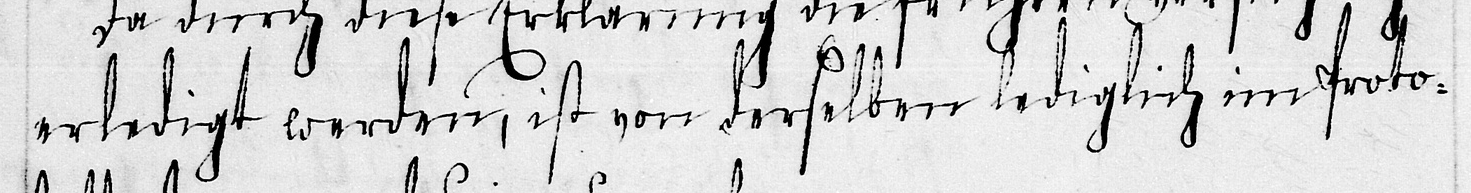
erledigt werden, ist von derselben lediglich im Proto¬
